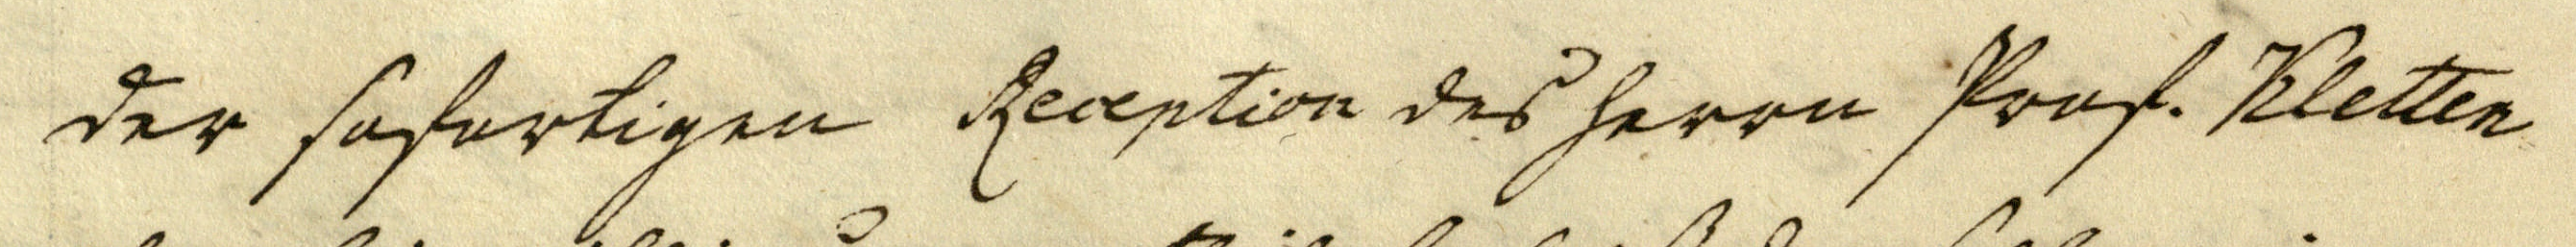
der sofortigen Reception des herrn Prof. Kletten
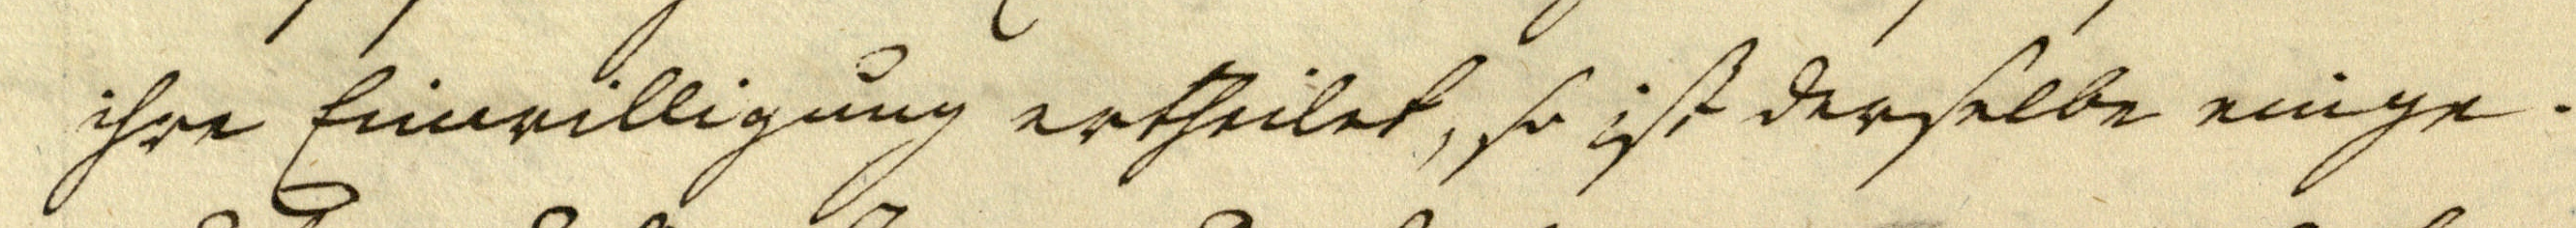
ihre Einwilligung ertheilet, so ist derselbe einge-
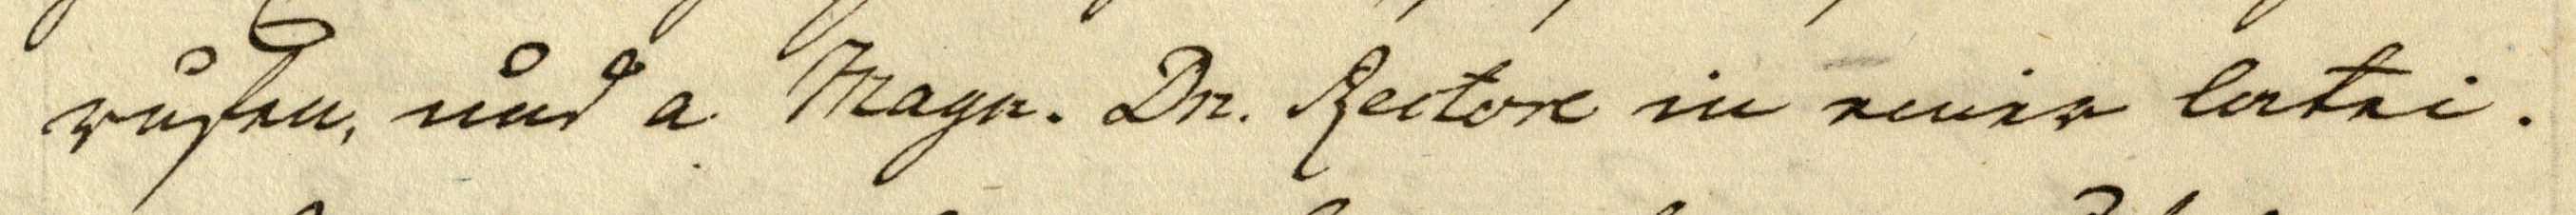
rufen, und a Magn. Dn. Rectore in einer latei-
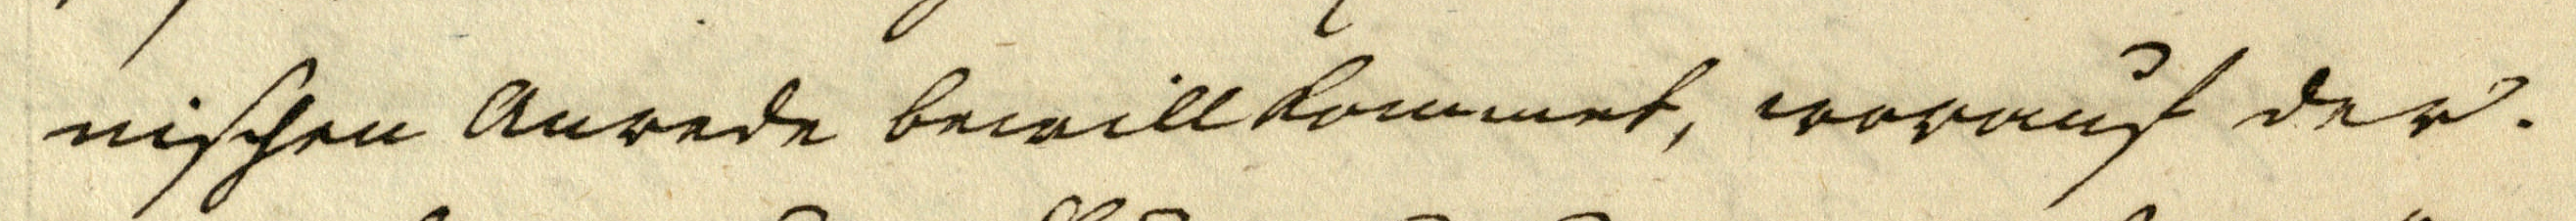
nischen Anrede bewillkommet, worauf der-
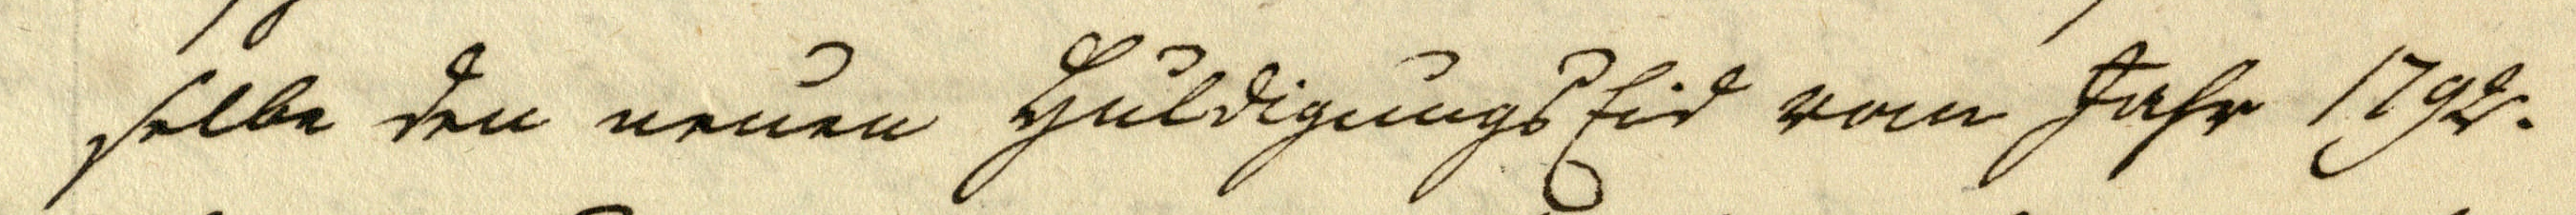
selbe den neuen Huldigungs Eid vom Jahr 1792.
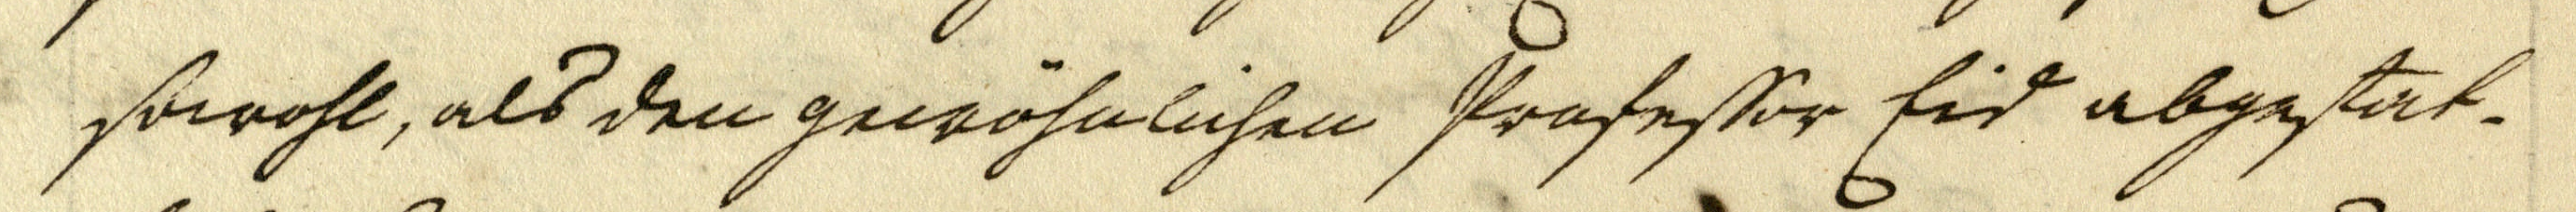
sowohl, als den gewöhnlichen Professor Eid abgestat-
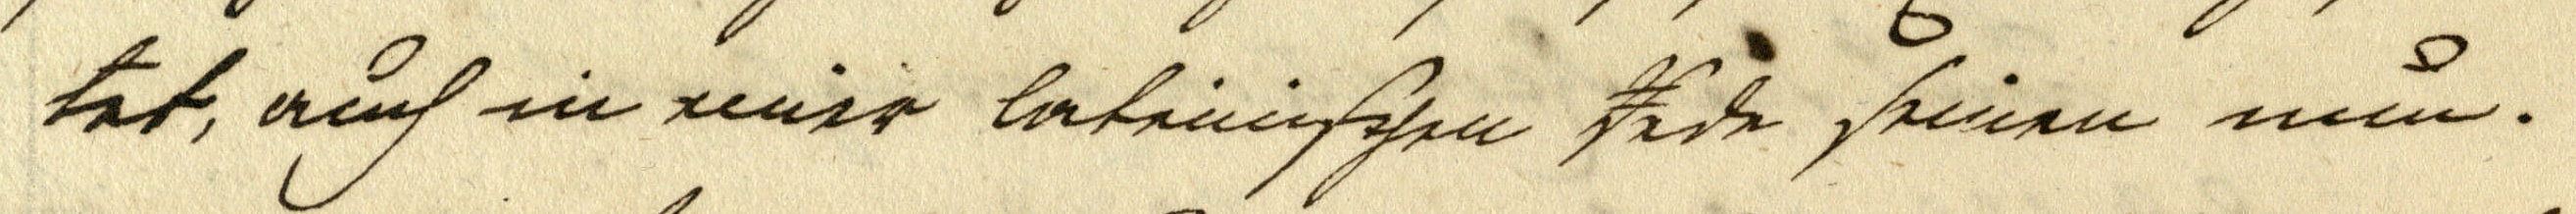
tet, auch in einer lateinischen Rede seinen nun-
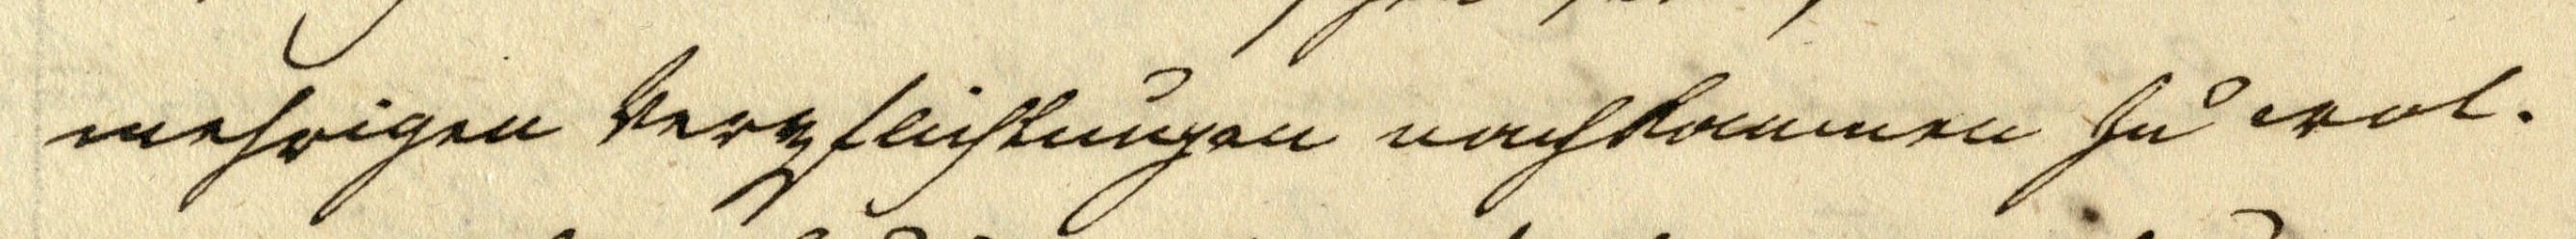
mehrigen Verpflichtungen nachkommen zu wol-
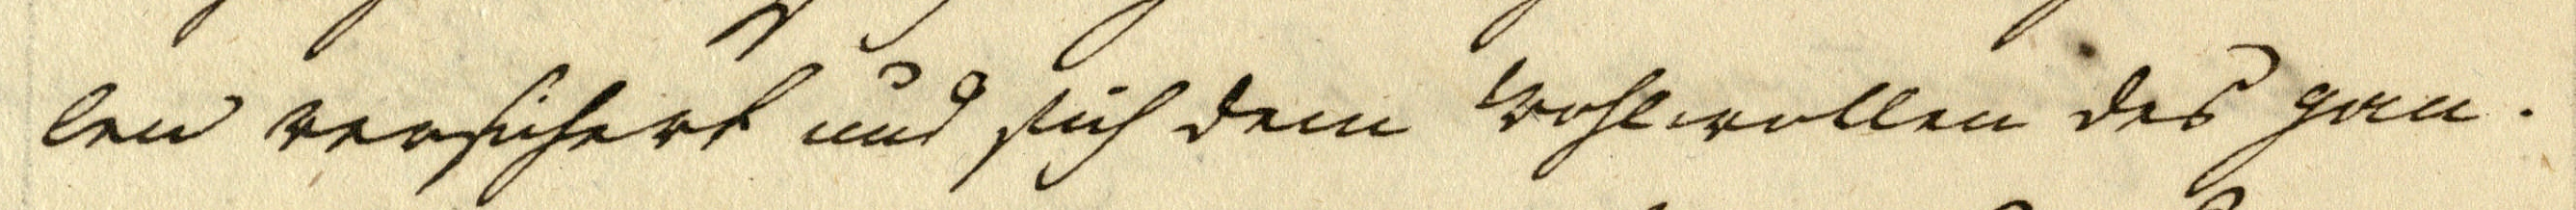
len versichert und sich dem Wohlwollen des gan-
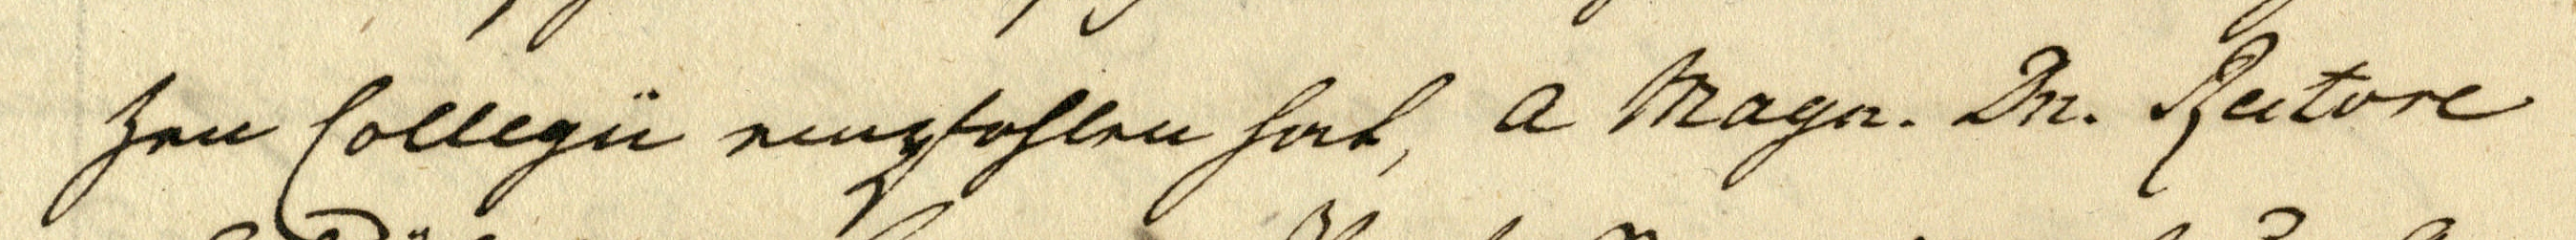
zen Collegii empfohlen hat, a Magn. Dn. Rectore
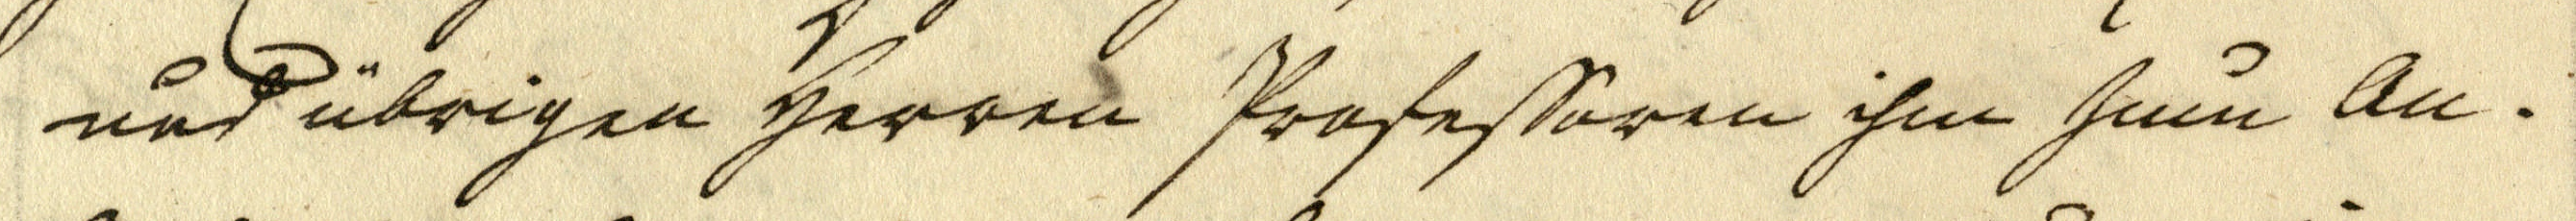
und übrigen Herren Professoren ihm zum An-
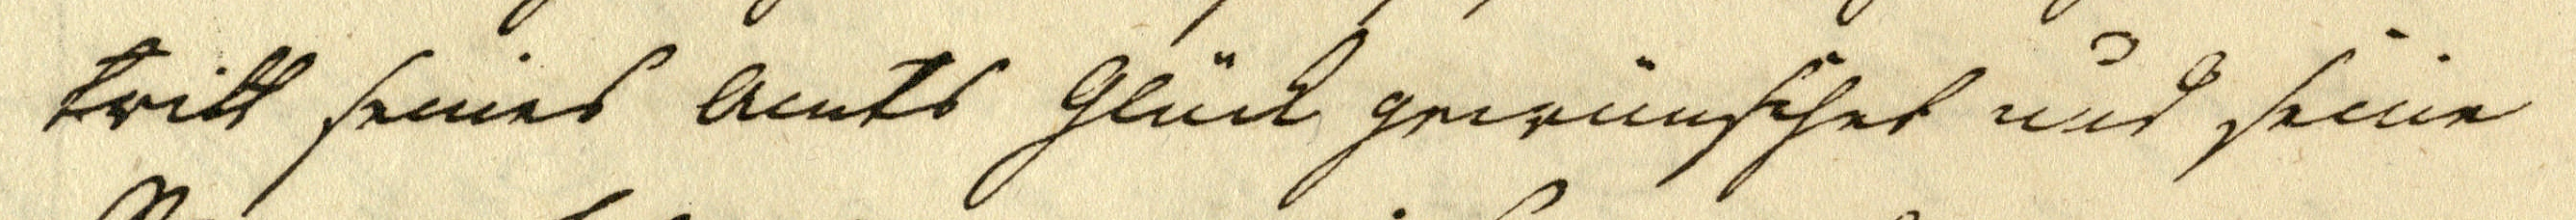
tritt seines Amts Glück gewünschet und seine
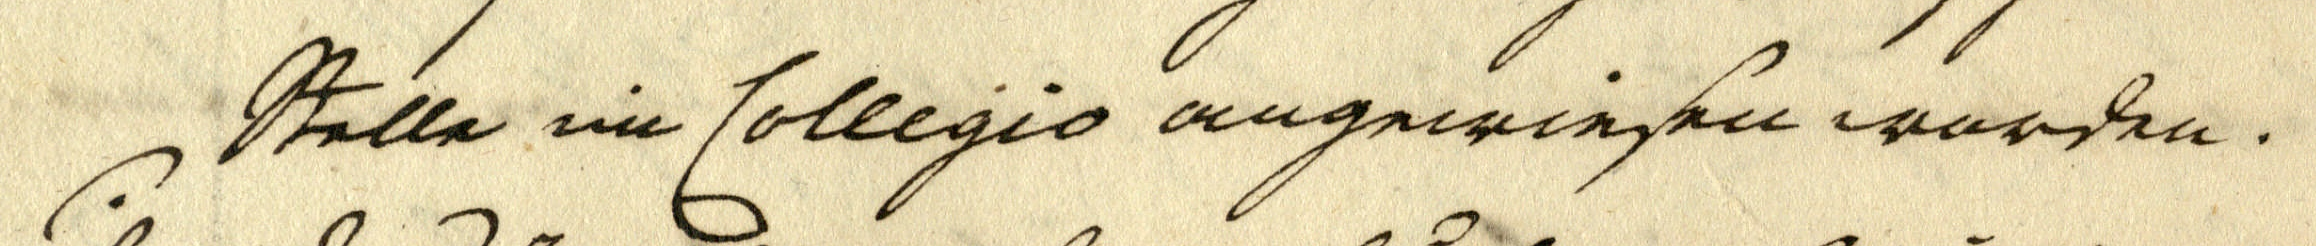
Stelle im Collegio angewiesen worden.
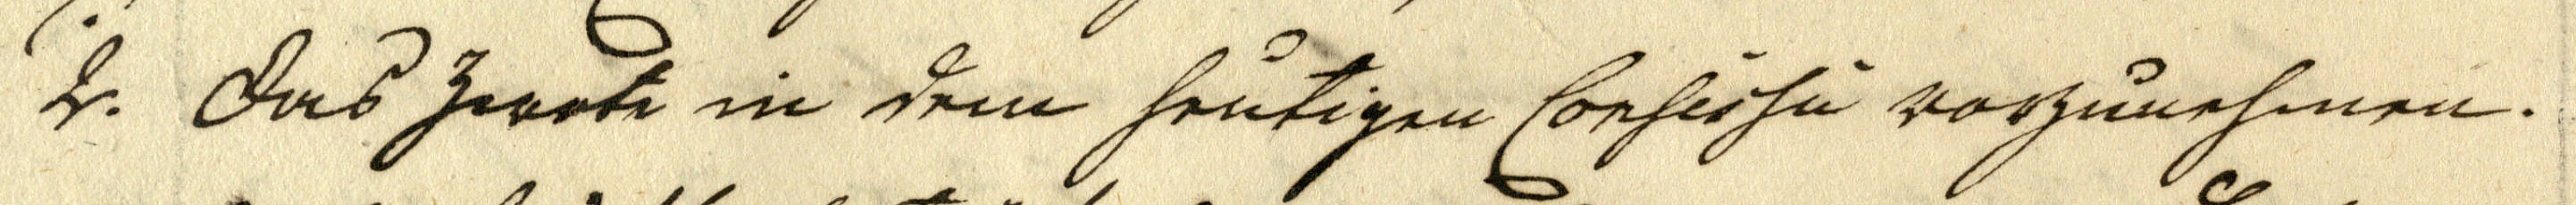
2. Das Zwote in dem heutigen Consessu vorzunehmen-
